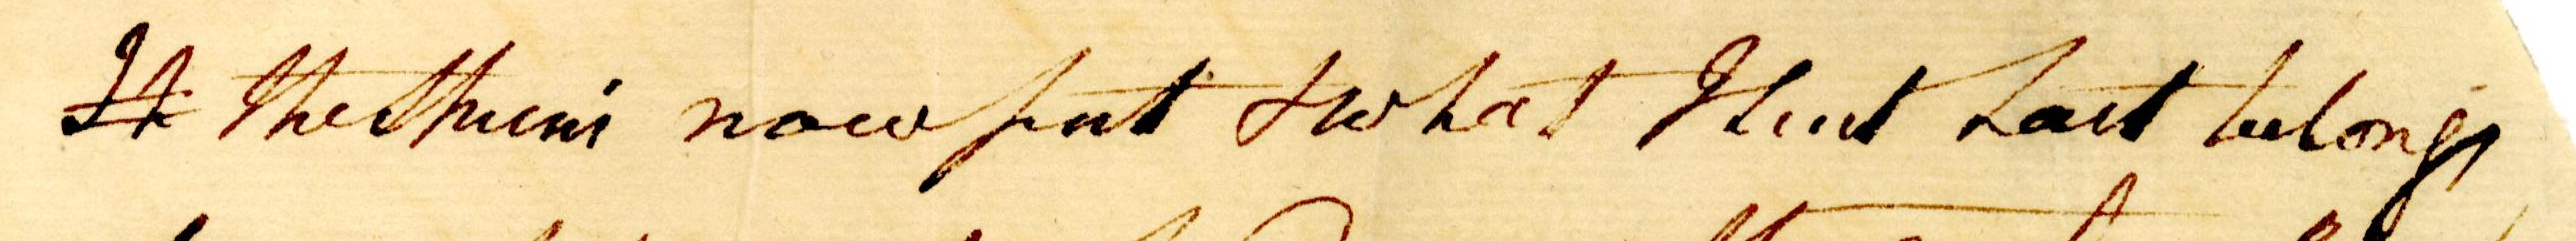[_] the skins now put & what I sent Last belongs
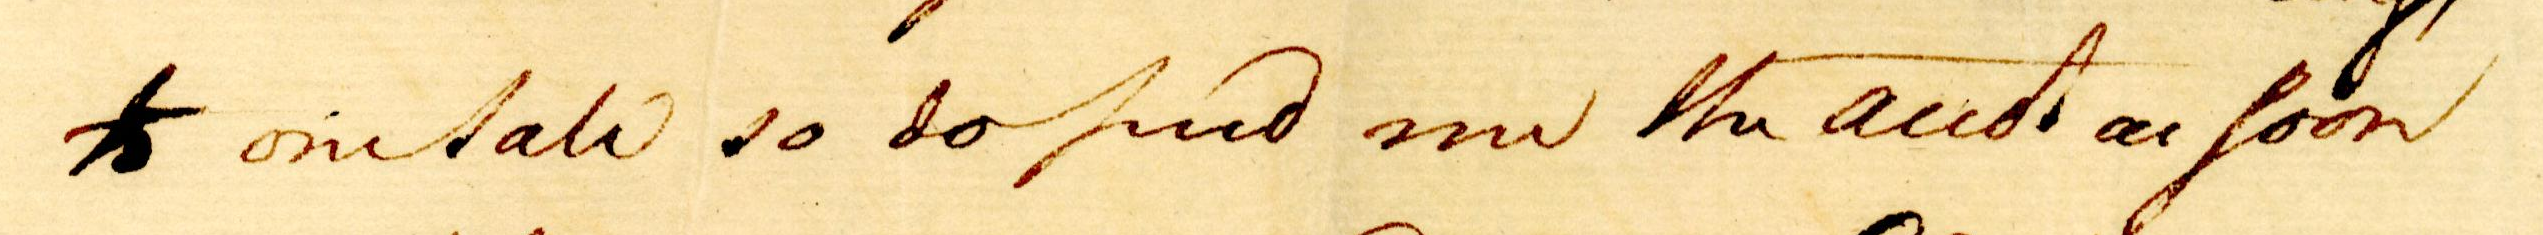to one sale so do send me the acco^t as soon
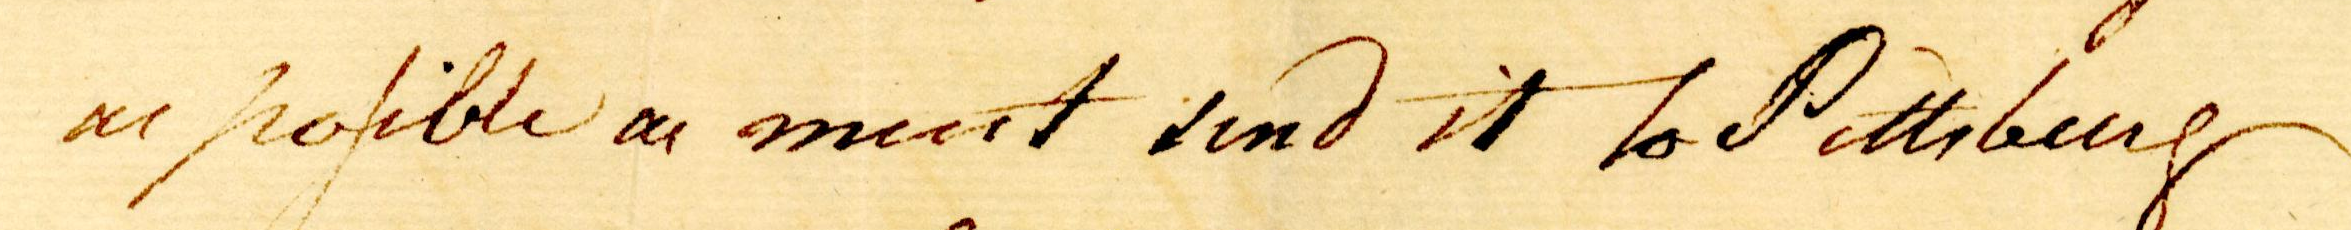as posible as must send it to Pittsburg
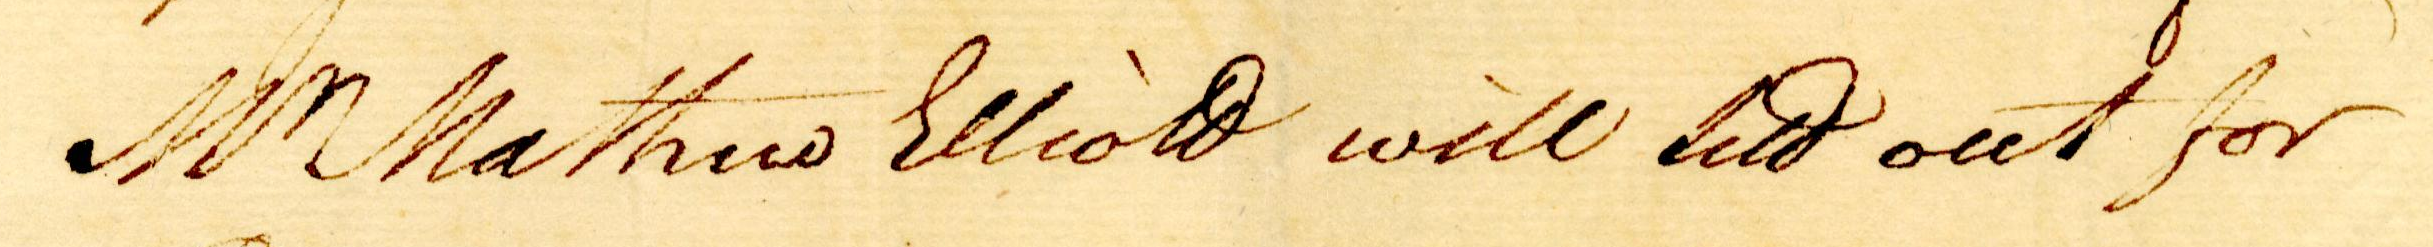W^m Mathew Elliott will setd out for
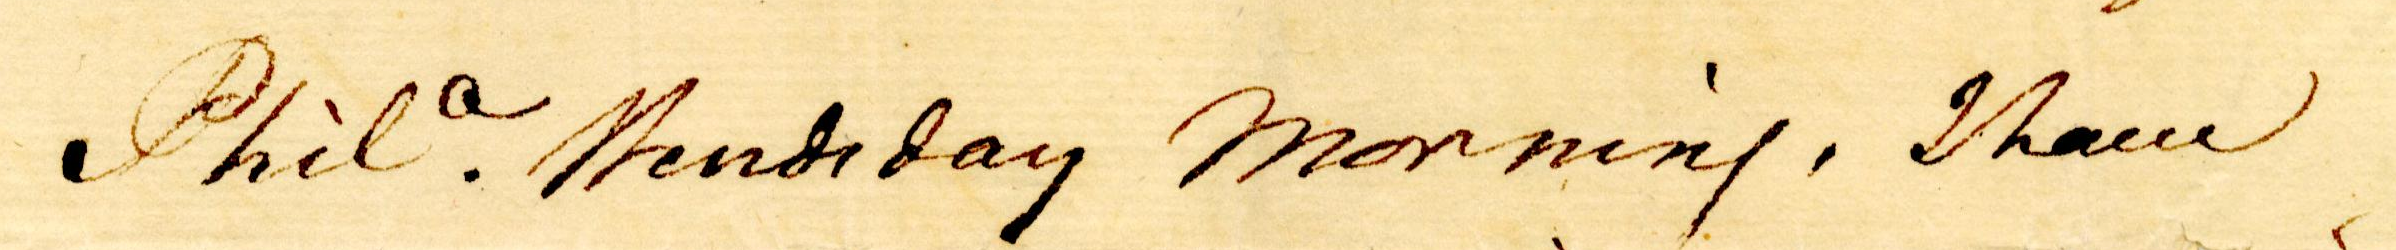Phil^a. Wendsday morning, I have
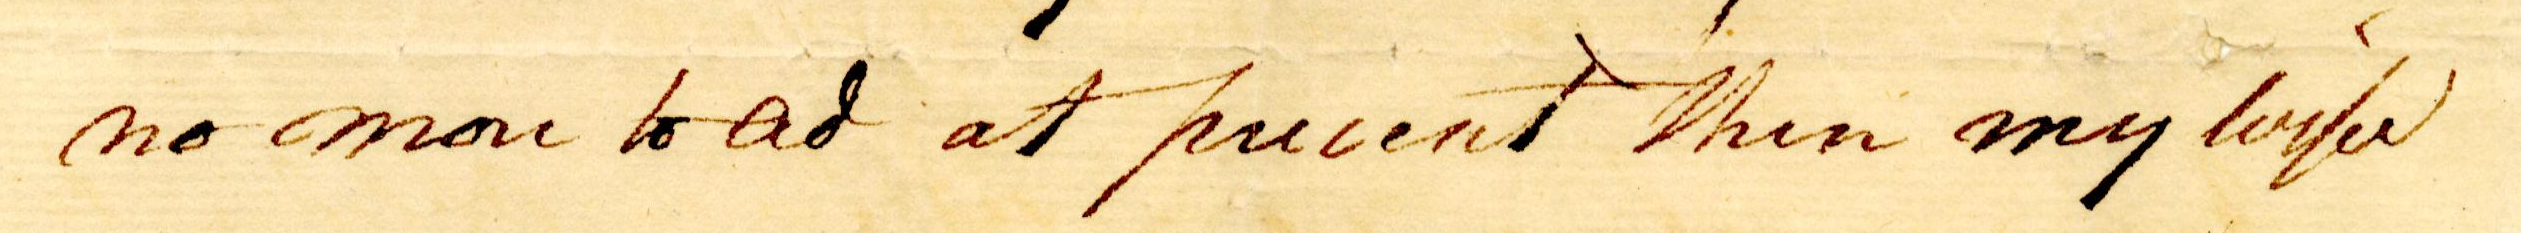no more to ad at precent then my wife
